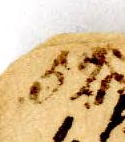54
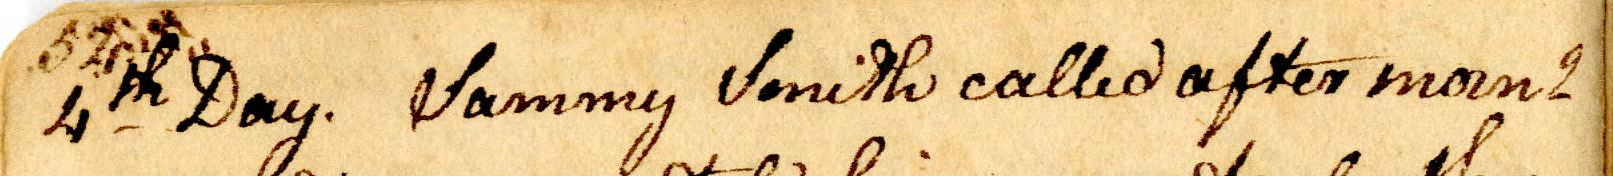4^th Day. Sammy Smith called after morn^g
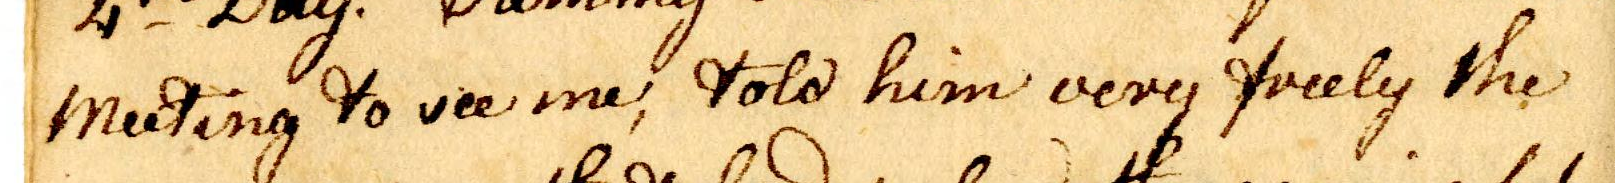Meeting to see me, told him very freely the
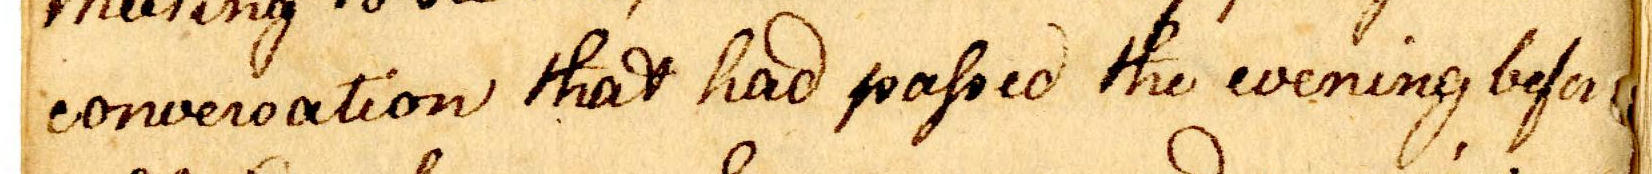conversation that had passed the evening befor
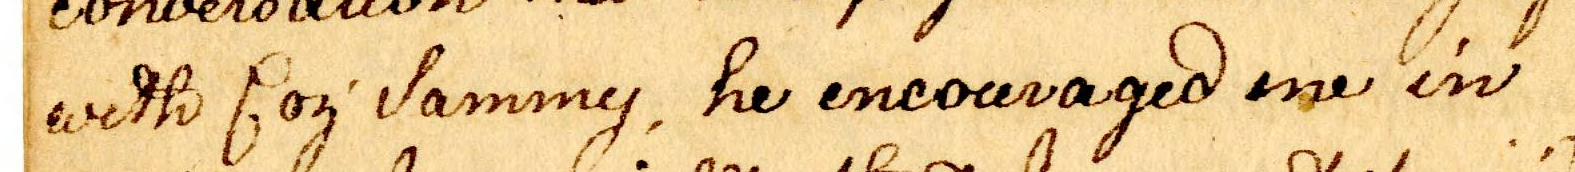with Coz Sammy, he encouraged me in
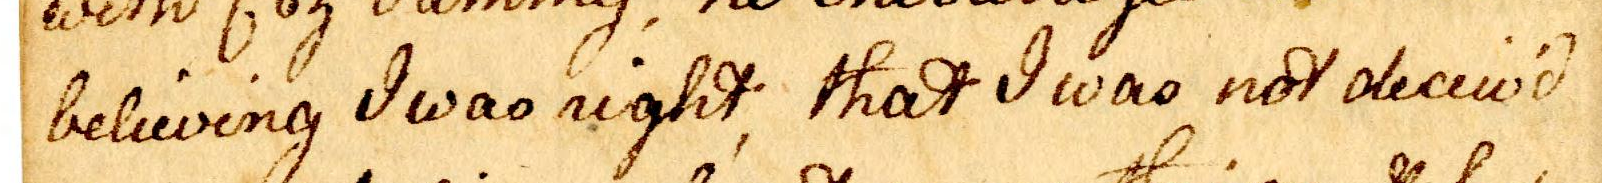believing I was right that I was not deceiv'd
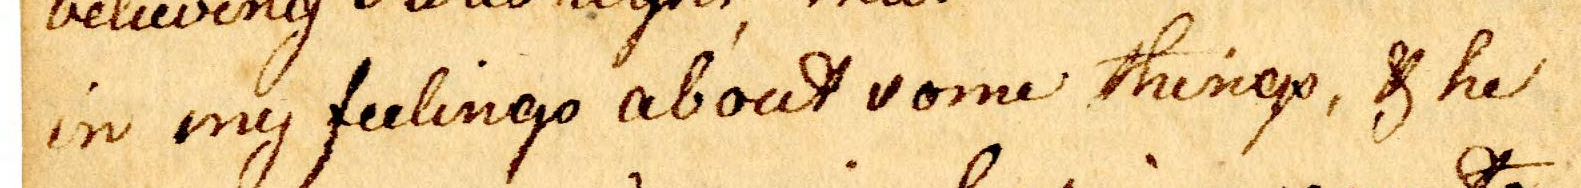in my feelings about some things, & he
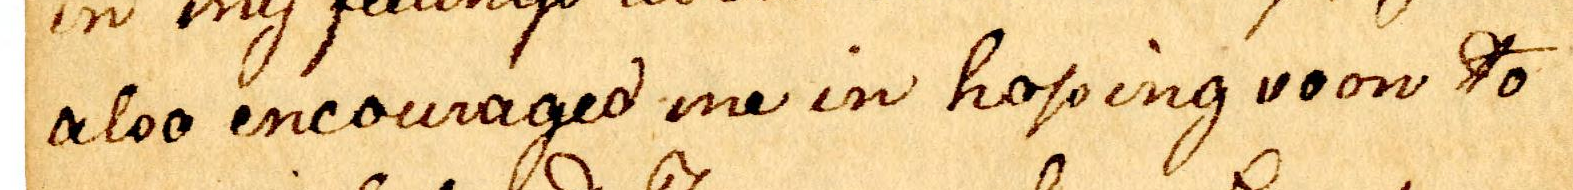also encouraged me in hoping soon to
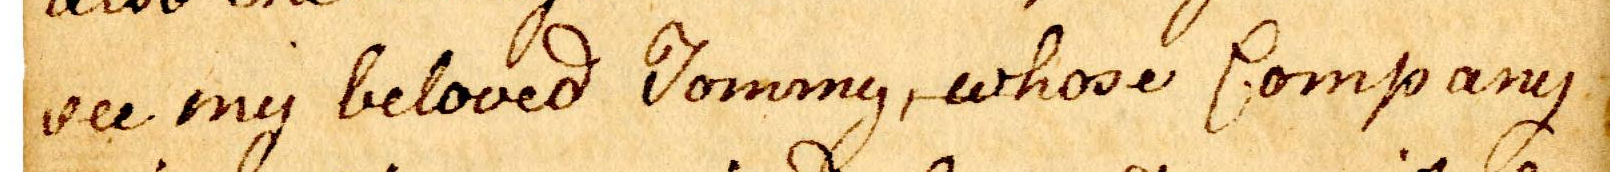see my beloved Tommy, whose Company
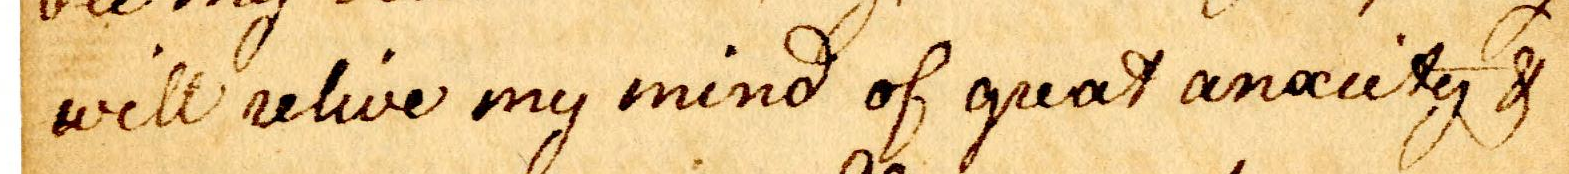will relive my mind of great anxiety &
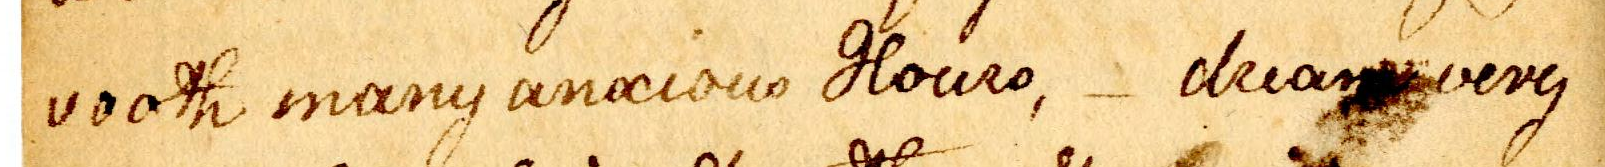sooth many anxious Hours,- dream very
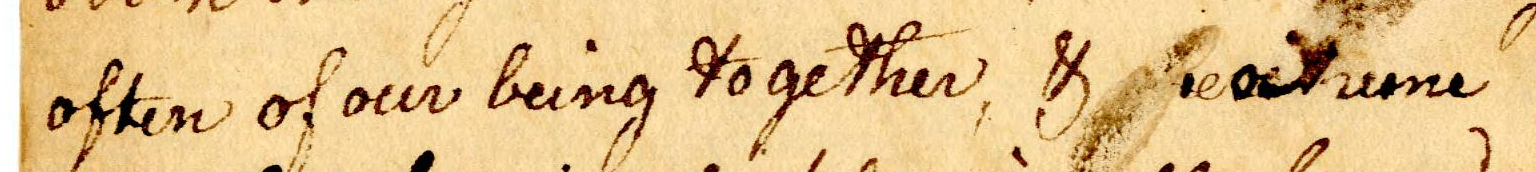often of our being together, & extreme
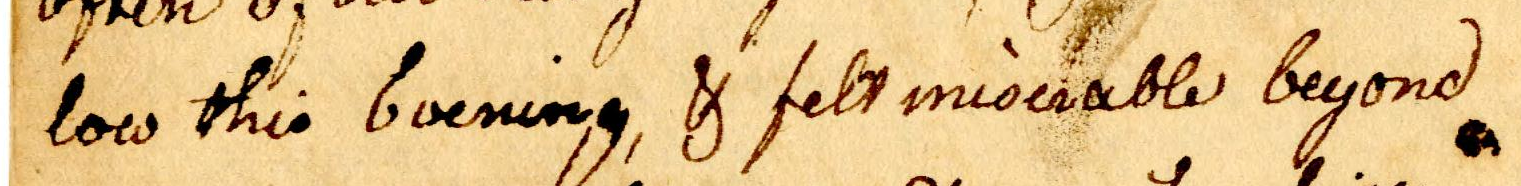low this Evening, & felt miserable beyond
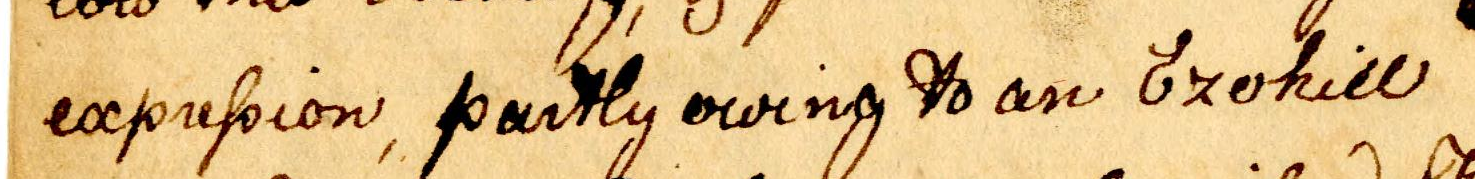expression, partly owing to an Ezekiel
